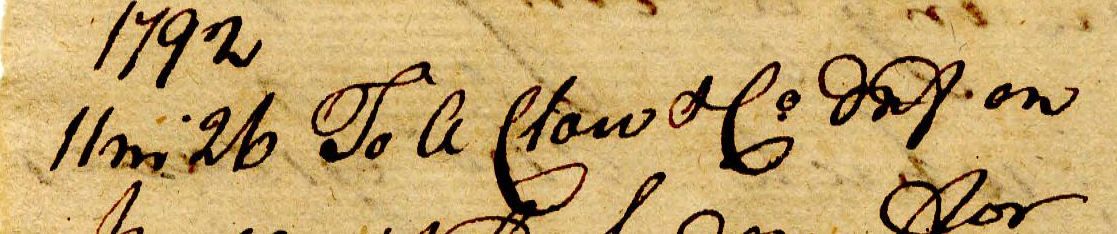11 m^o 26 To A Clow & C^o. drf on
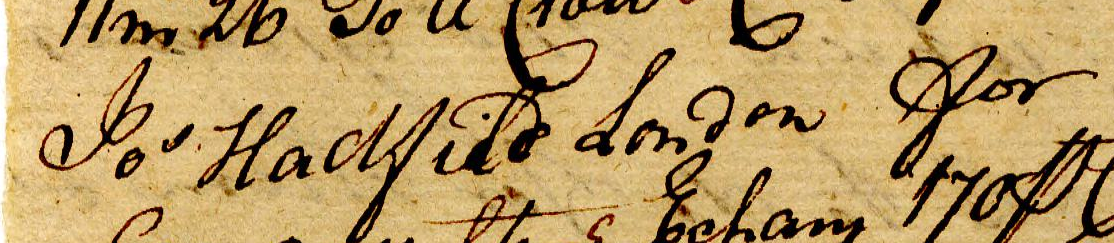Jo^s Hadfield London for
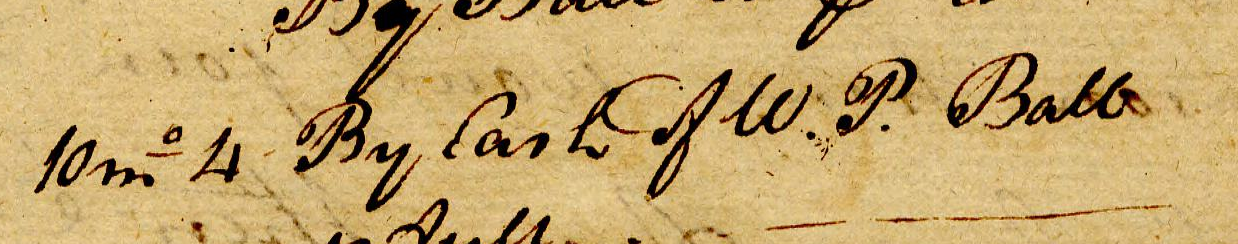10 m^0 4 By Cash of W. P. Ball
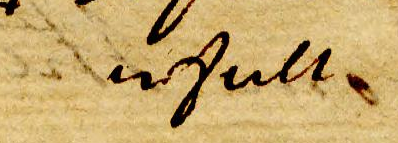in full
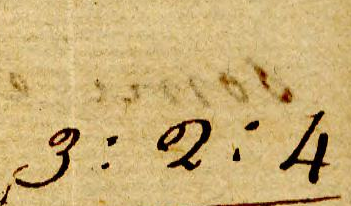3: 2: 4
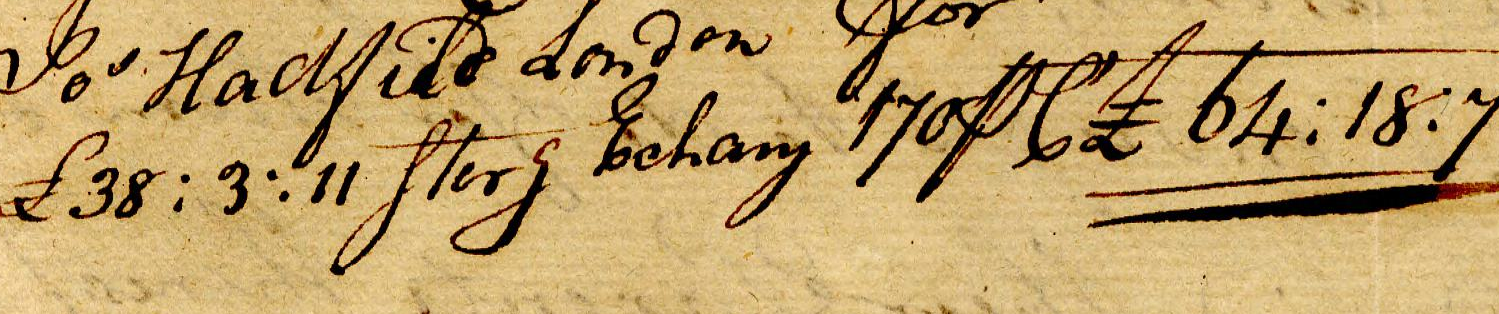£38:3:11 sterg Exchan 170 per C^t £64:18:7
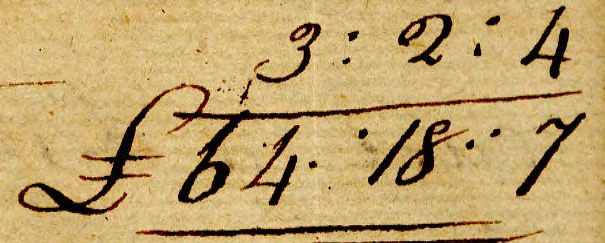£64:18:7
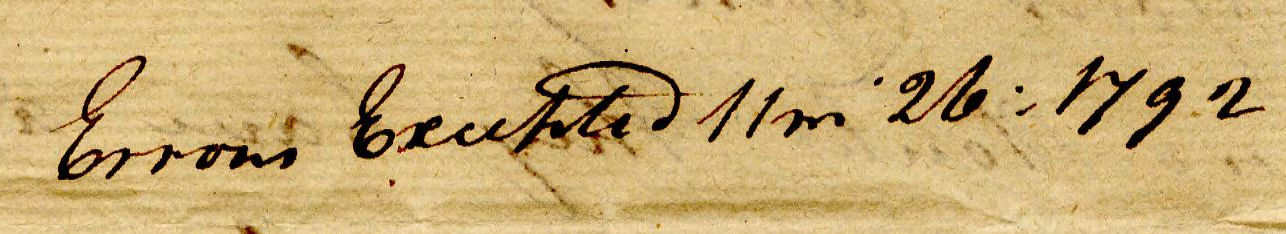Errors Excepted 11m^o 26: 1792
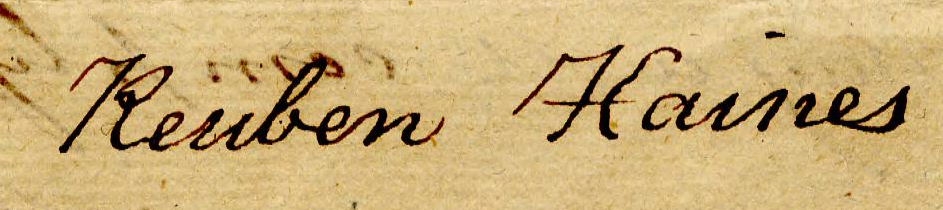Reuben Haines
